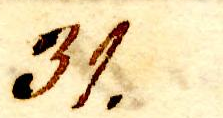31.
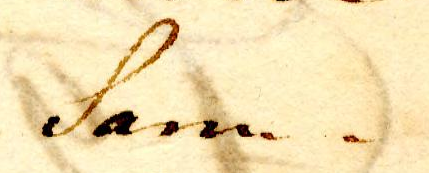Same
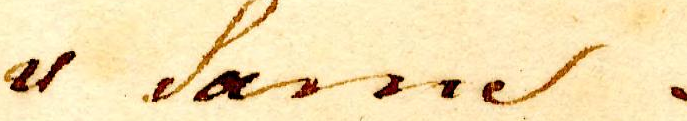v Same-
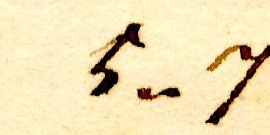5..7
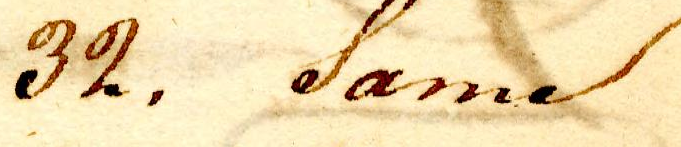32. Same
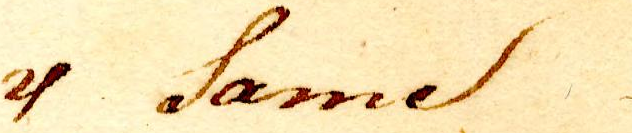v Same
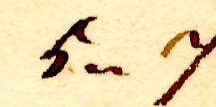5. 7
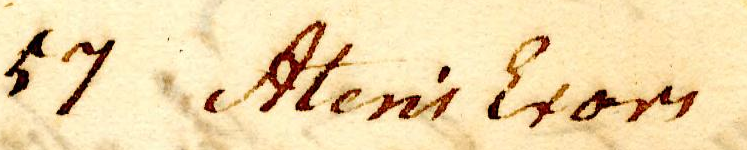57 Aten's Exors
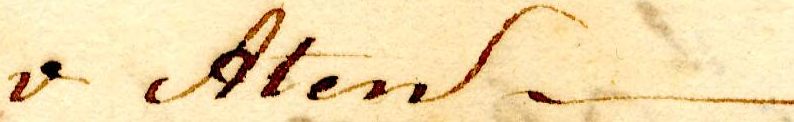v Aten-
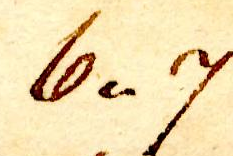6..7
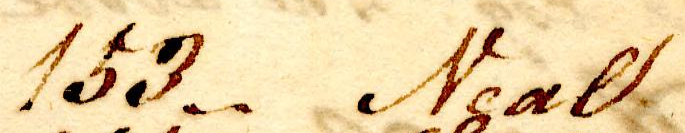153. Neal
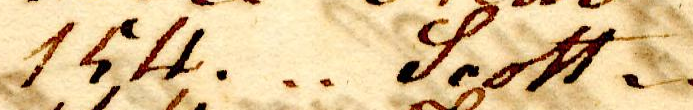154. .. Scott
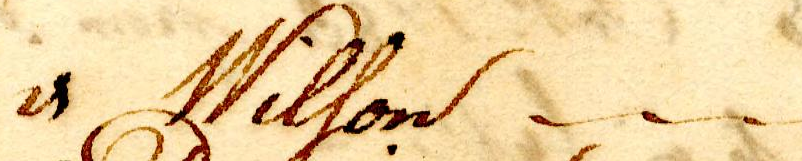v Wilson-
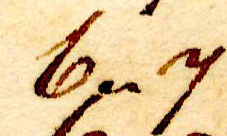6.7
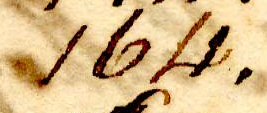164.
